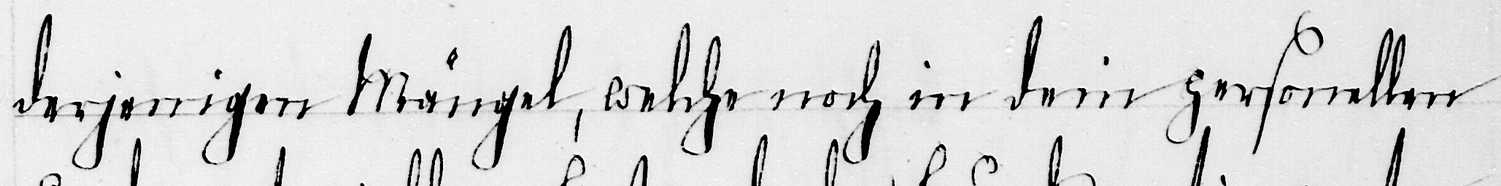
derjenigen Mängel, welche noch in dem personellen
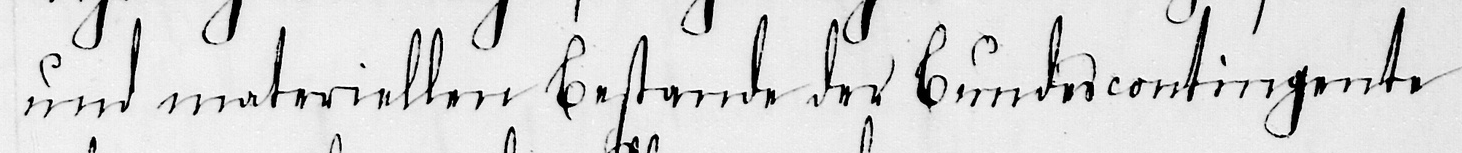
und materiellen Bestande der Bundescontingente
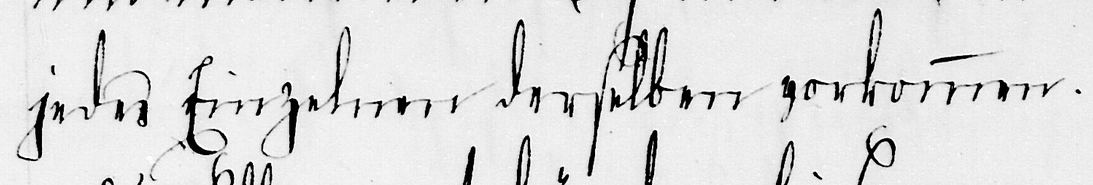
jedes Einzelnen derselben vorkommen.
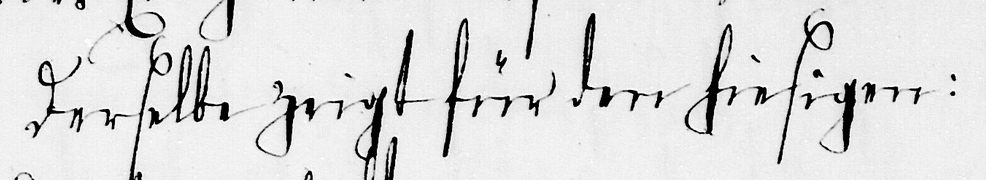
Derselbe zeigt für den hiesigen:
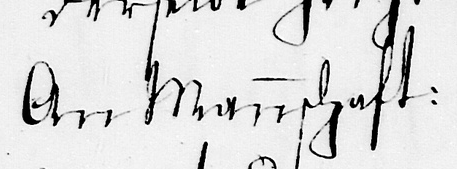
An Mannschaft:
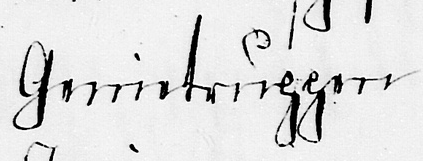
Genietruppen
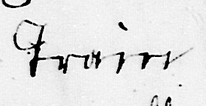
Train
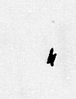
„
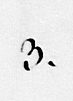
3.
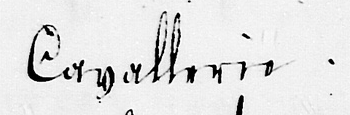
Cavallerie
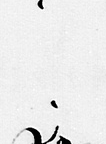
20.
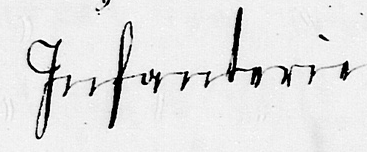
Infanterie
